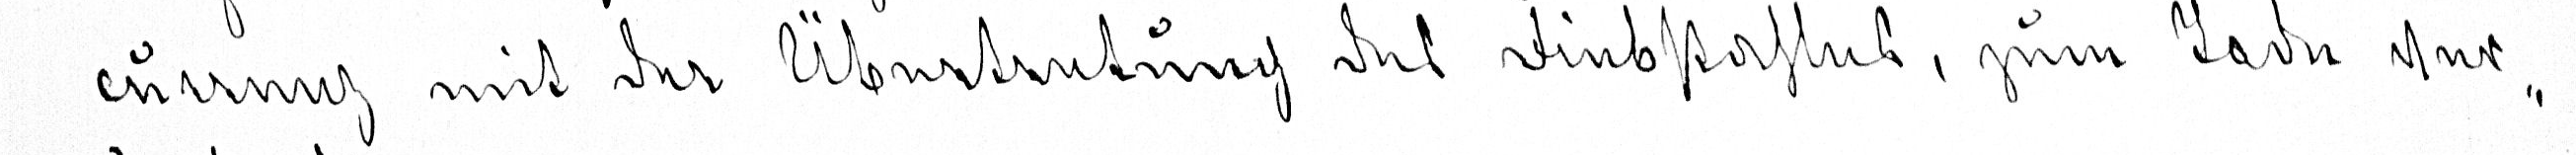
currenz mit der Übertretung des Diebstahles, zum Tode ver¬
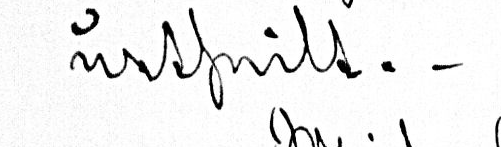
urtheilt. -
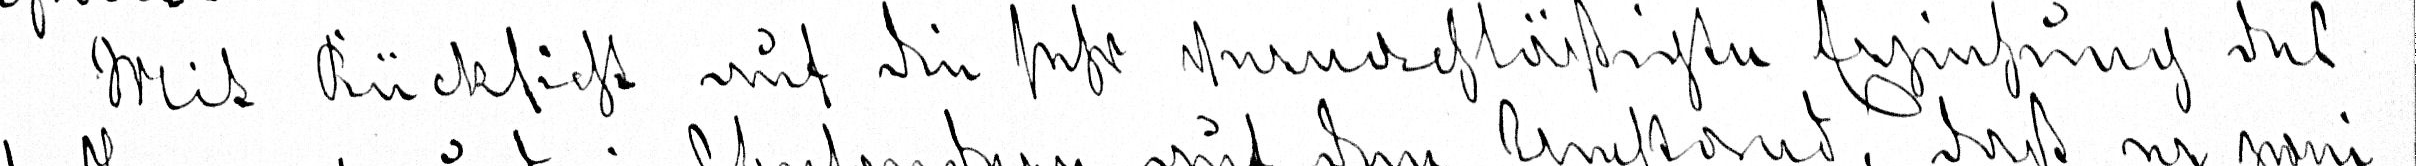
Mit Rücksicht auf die sehr vernachläßigte Erziehung des
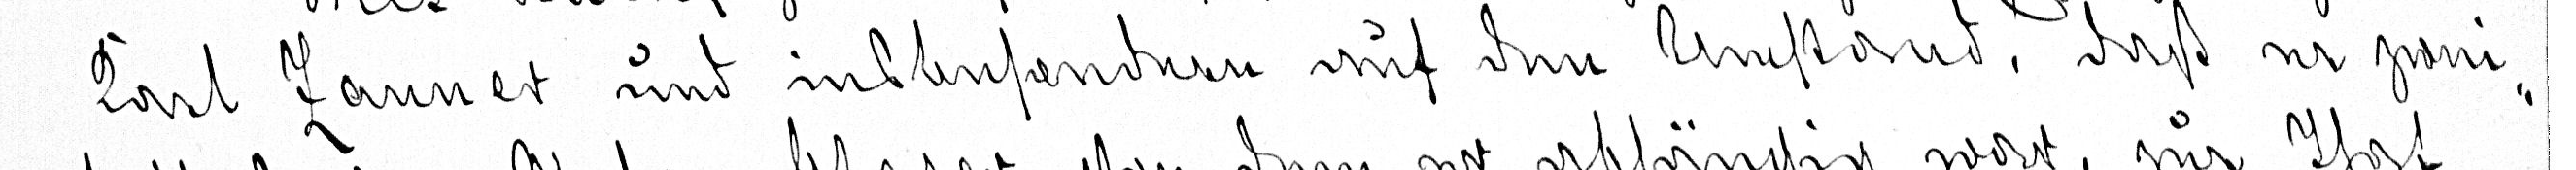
Karl Zauner und insbesondere auf den Umstand, daß er zwei¬
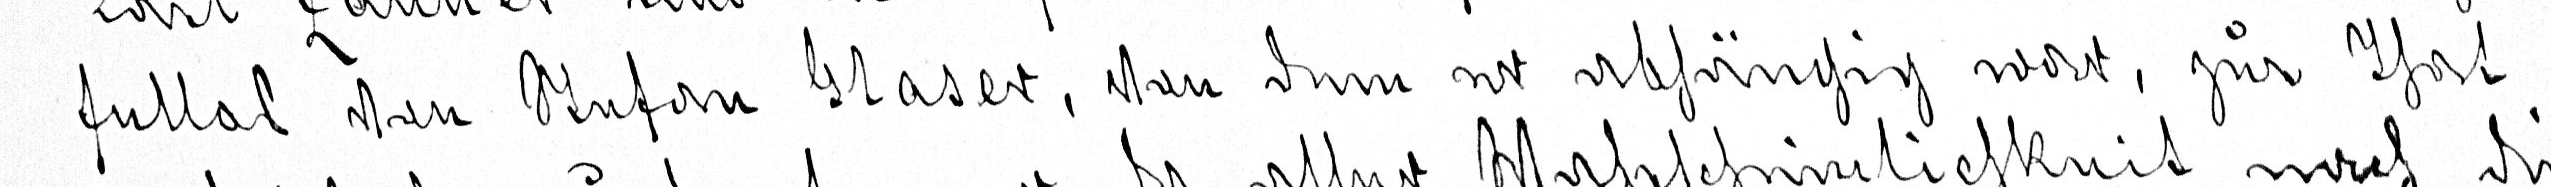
fellos von Stefan Glaser, von dem er abhängig war, zur That
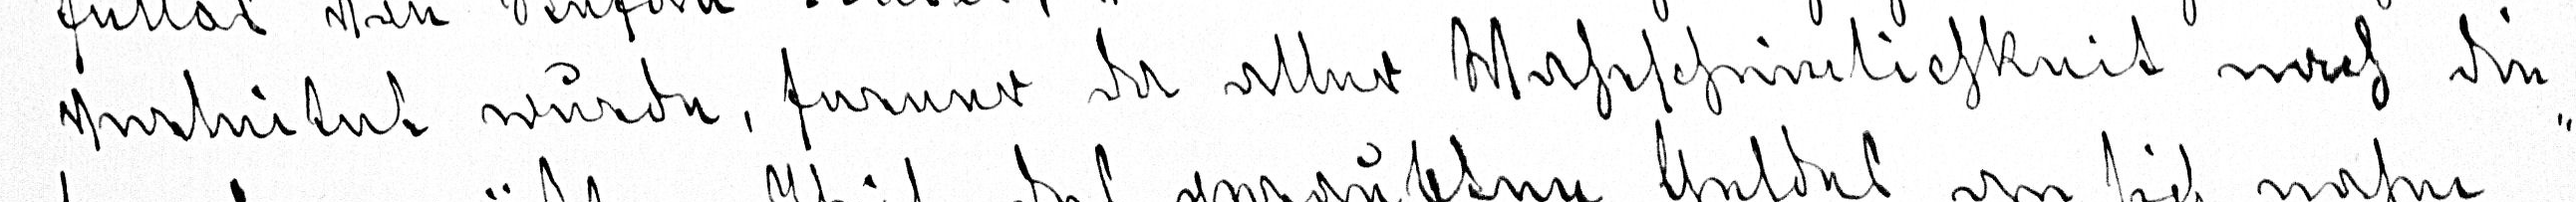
verleitet wurde, ferner der aller Wahrscheinlichkeit nach die¬
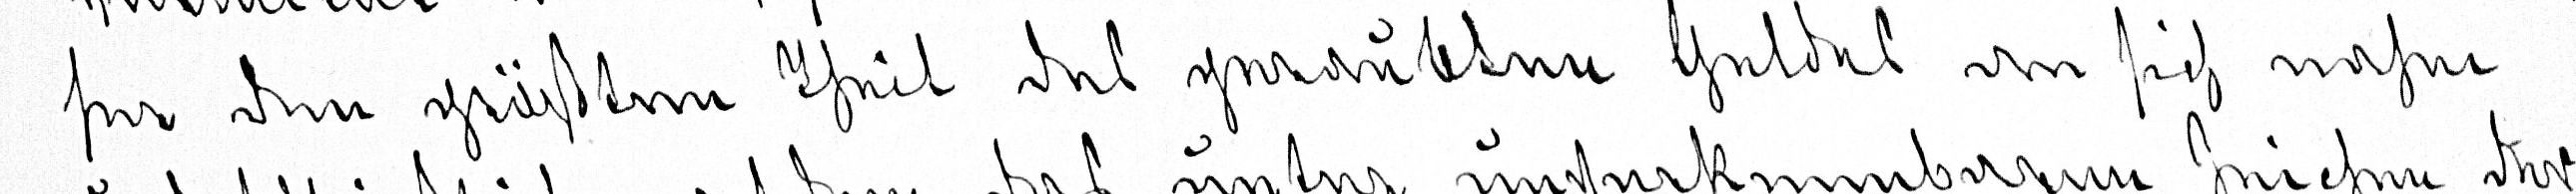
ser dem größten Theil des geraubten Geldes an sich nahm
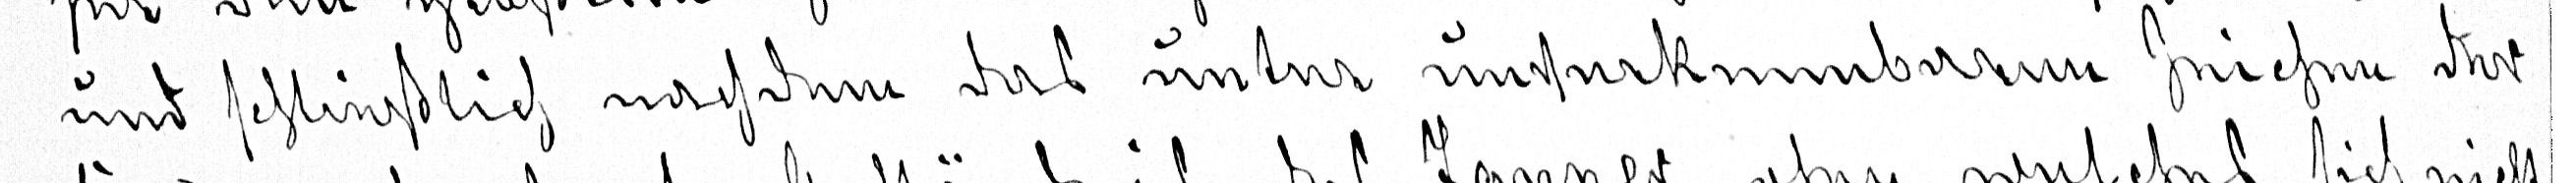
und schließlich nachdem das unter unverkennbaren Zeichen der
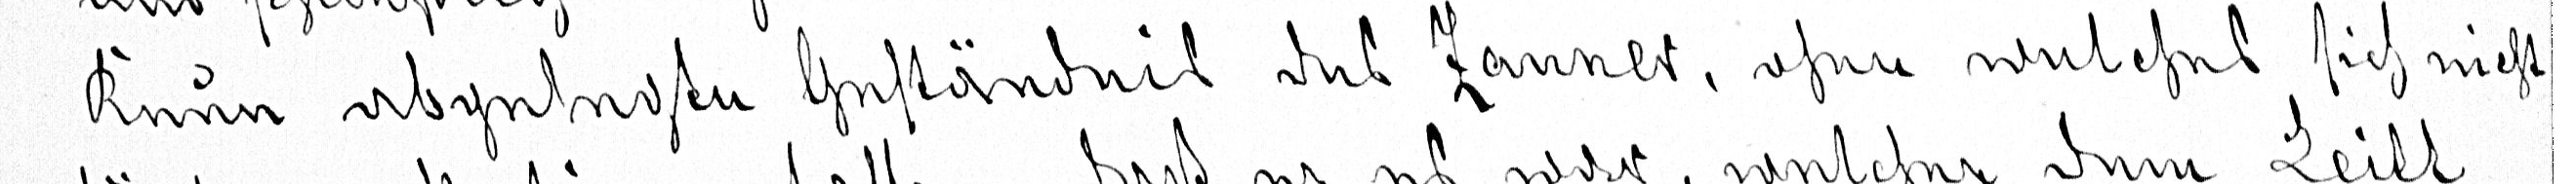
Keun abgelegte Geständnis des Zauner, ohne welches sich nicht
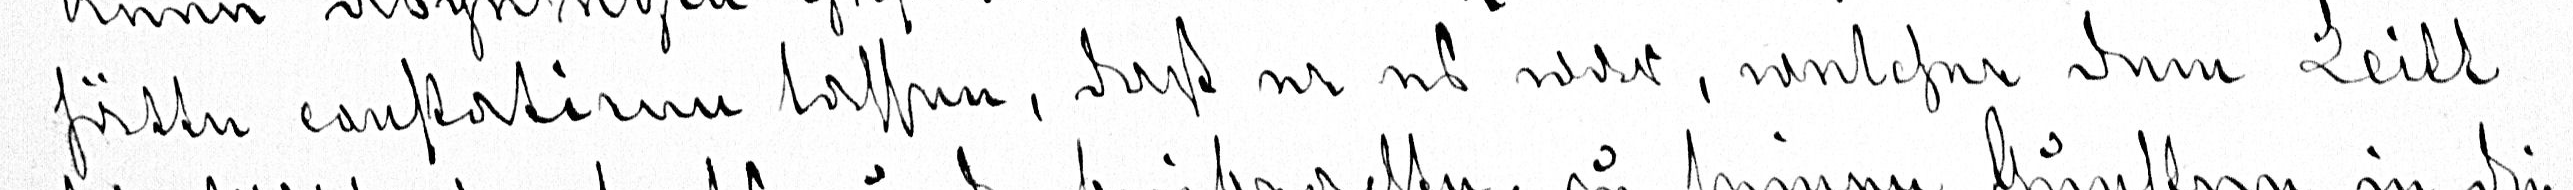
hätte constatiren lassen, daß er es war, welche dem Leitl
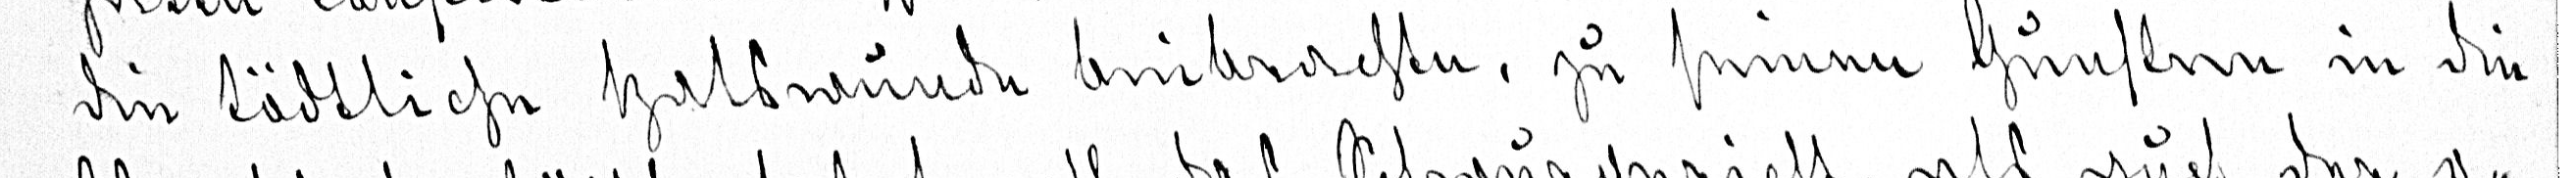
die tödtliche Halswunde beibrachte, zu seinen Gunsten in die
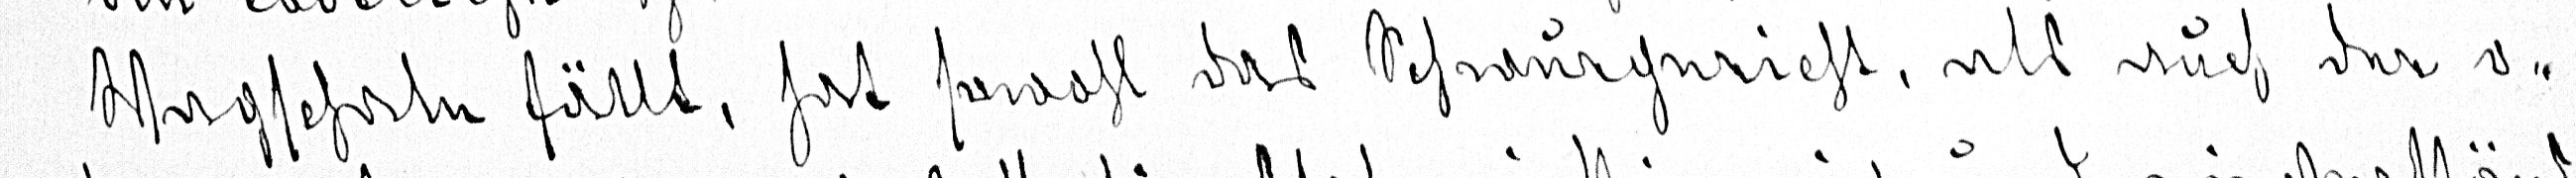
Wagschale fällt, hat sowohl das Schwurgericht, als auch der o¬
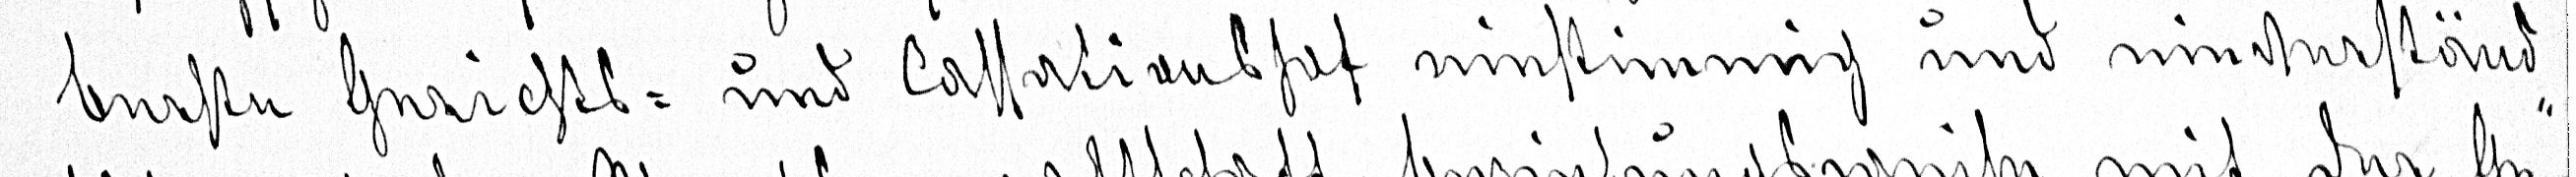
berste Gerichts = und Cassationshof einstimmig und einverständ¬
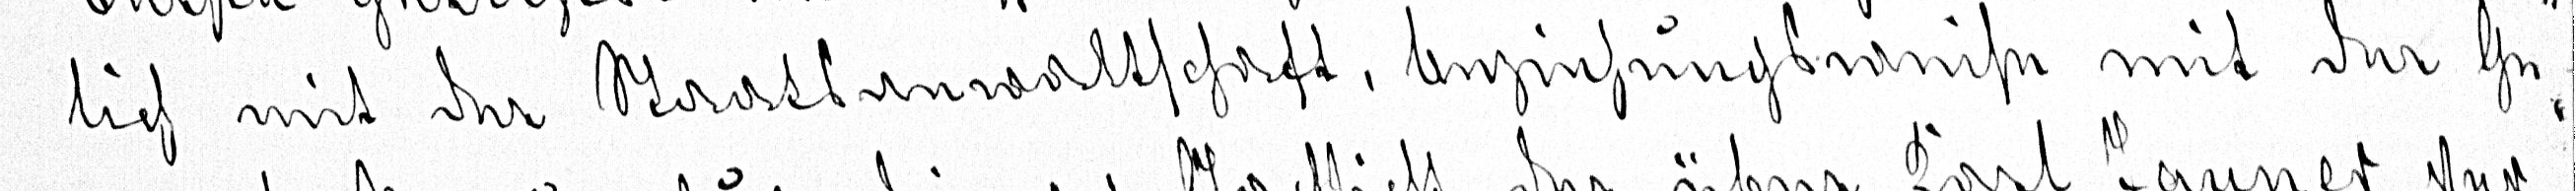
lich mit der Staatsanwaltschaft, beziehungsweise mit der Ge¬
